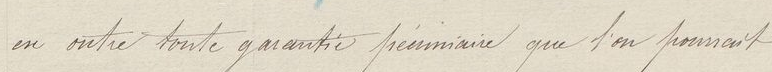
en outre toute garantie pécuniaire que l'on pourrait
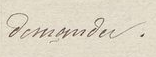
demander. –
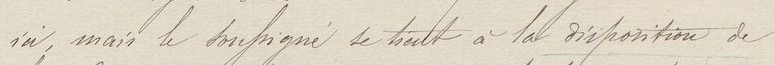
ici, mais le soussigné se tient à la disposition de
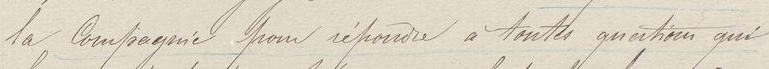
la Compagnie pour répondre à toutes questions qui
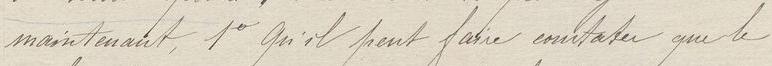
maintenant, 1o Qu'il peut faire constater que le
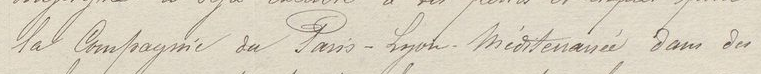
la Compagnie de Paris–Lyon. Méditerannée dans des
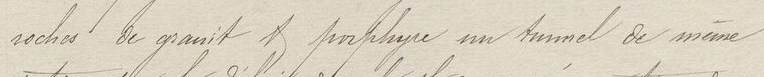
roches de granit & porphyre un tunnel de même
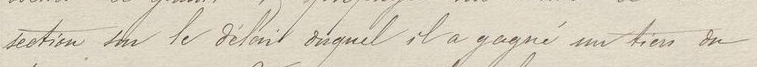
section sur le délai duquel il a gagné un tiers du
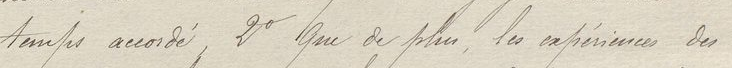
temps accordé, 2o Que de plus, les expériences des
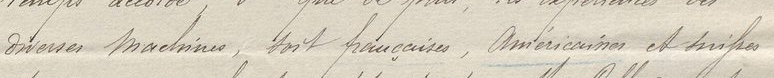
diverses machines, soit françaises, Américaines et suisses
